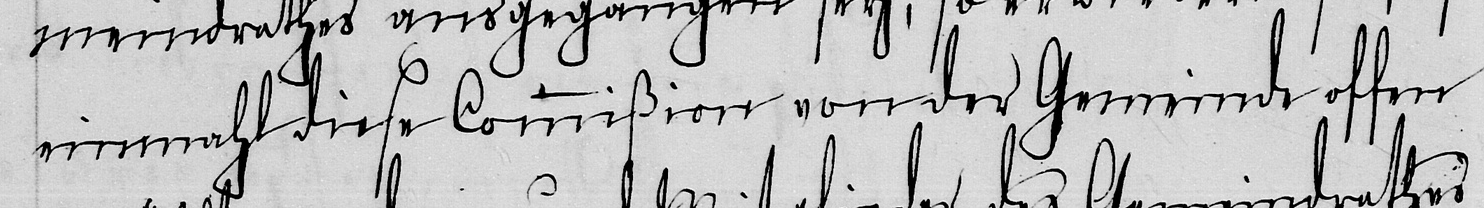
einmahl diese Commißion von der Gemeinde offen
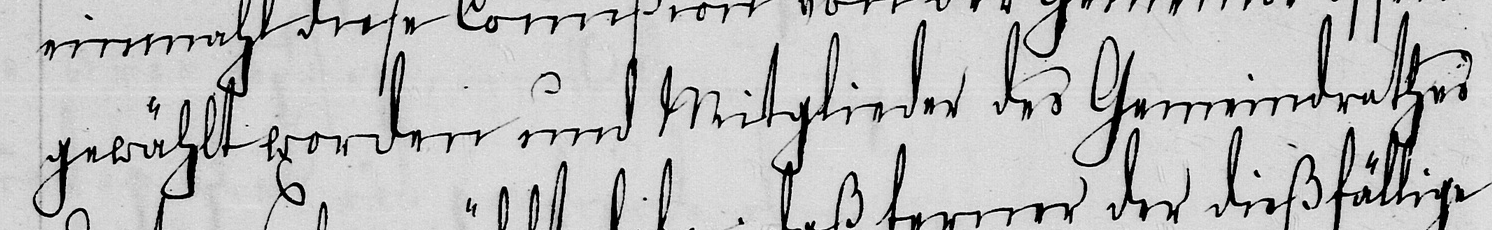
gewählt worden und Mitglieder des Gemeindrathes
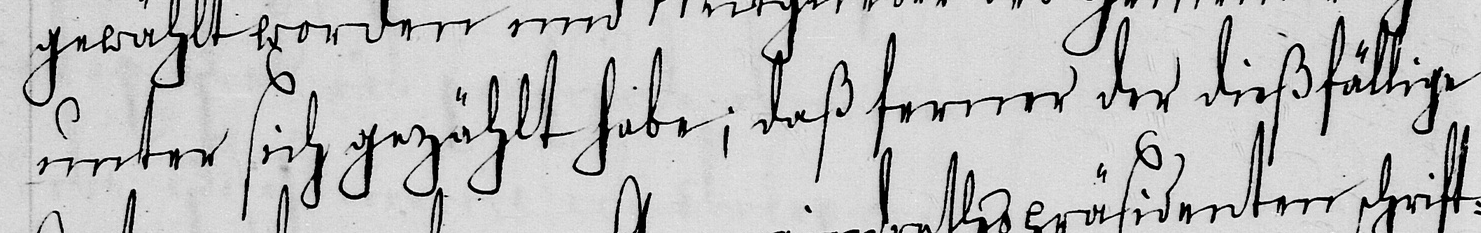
unter sich gezählt habe; daß ferner der dießfällige
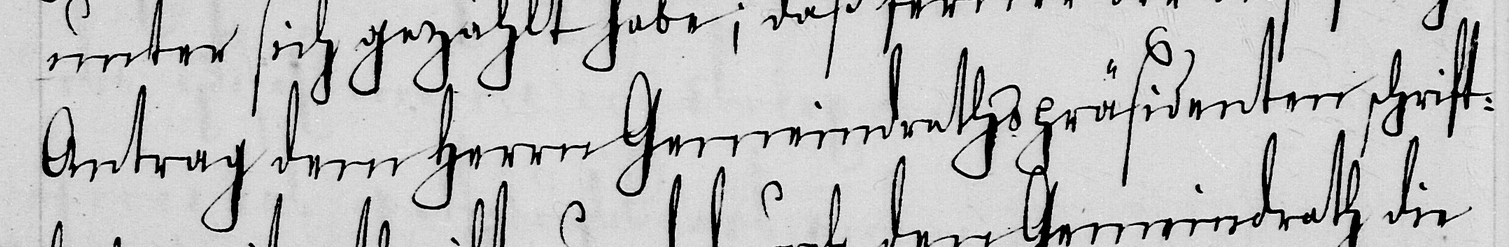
Antrag dem Herrn Gemeindrathspräsidenten schrif¬
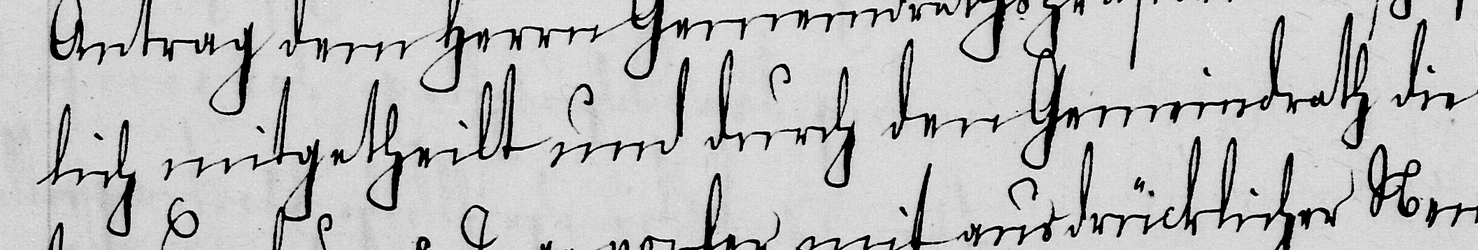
tlich mitgetheilt und durch den Gemeindrath die
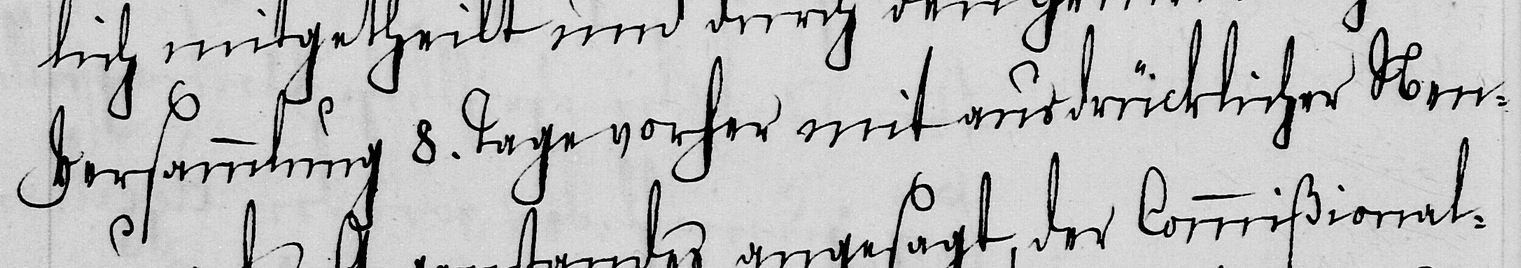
Versammlung 8. Tage vorher mit ausdrücklicher Nen¬
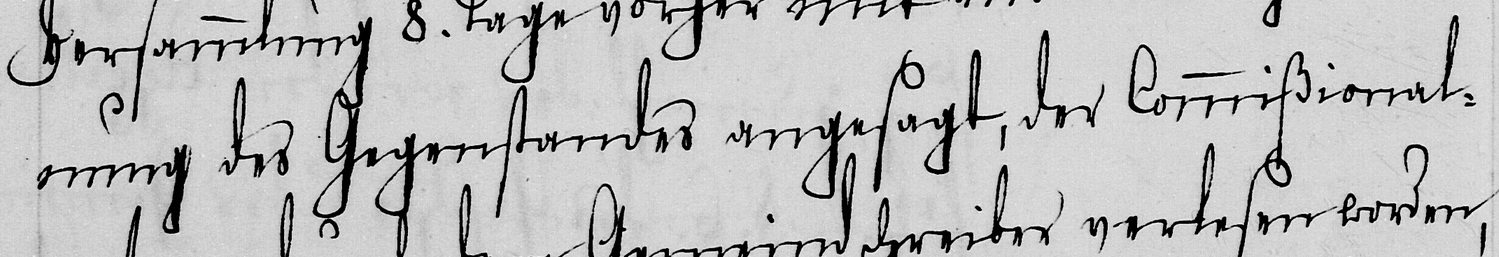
nung des Gegenstandes angesagt, der Commißional¬
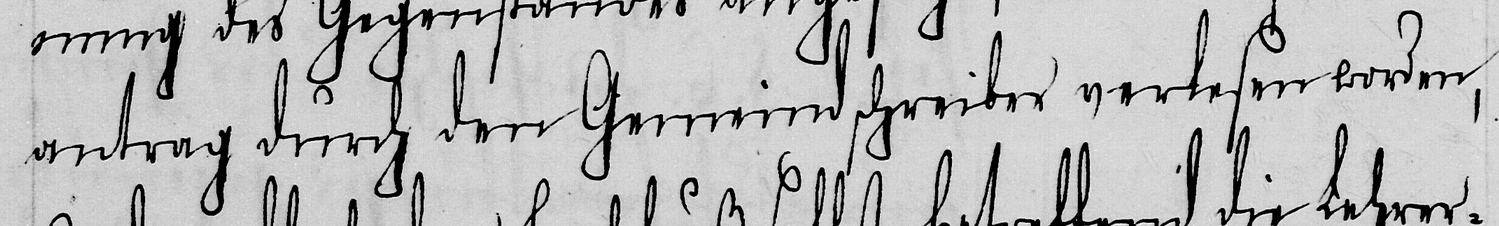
antrag durch den Gemeindschreiber verlesen worden,
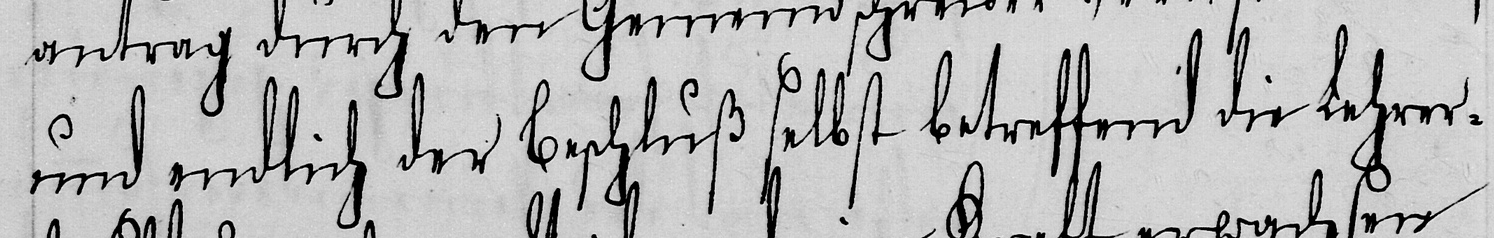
und endlich der Beschluß selbst betreffend die Lehre¬
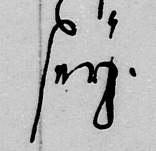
sey.
